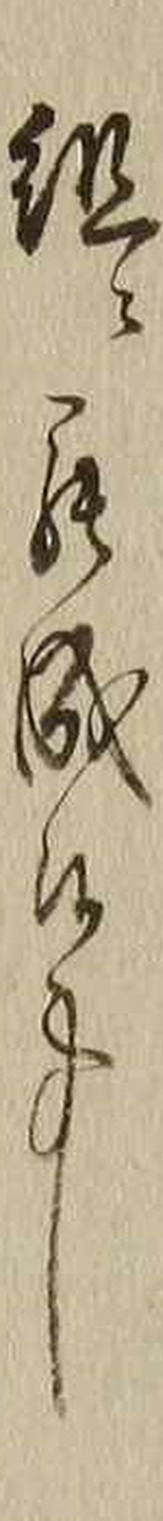組ニ罷成候事
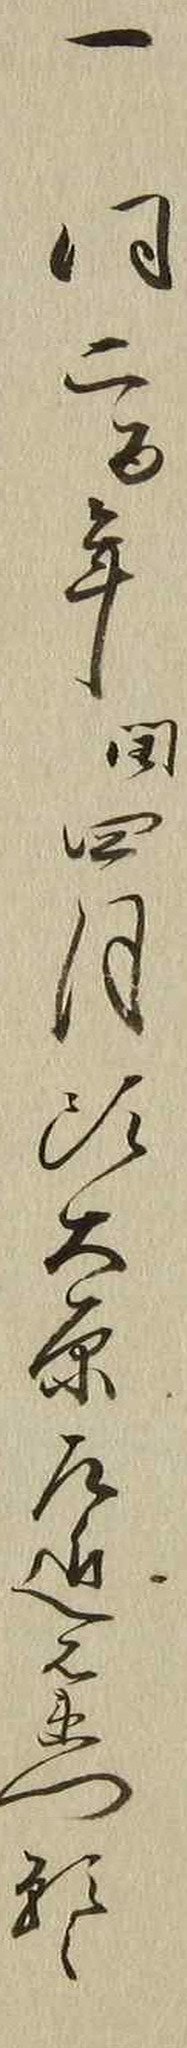一同二酉年閏四月頭大原左近右衛門願之
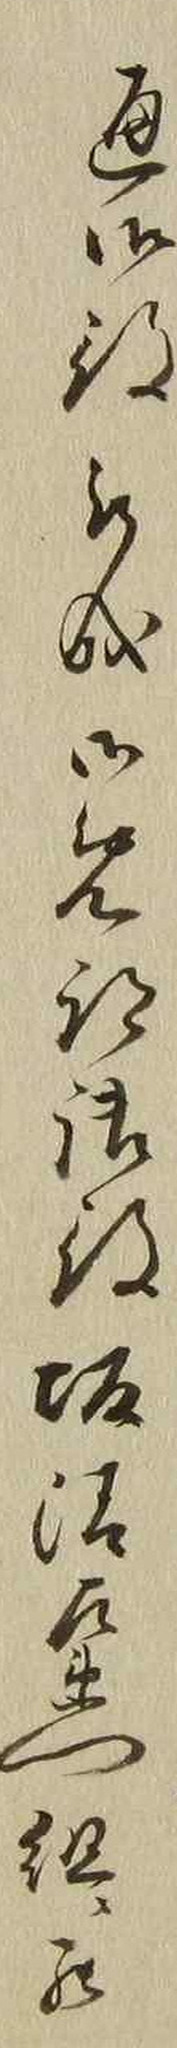通御役被成御免跡御役坂清左衛門組ニ罷
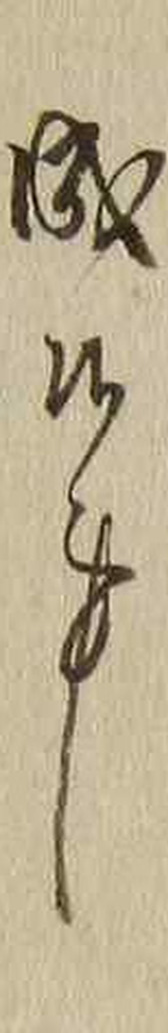成候事
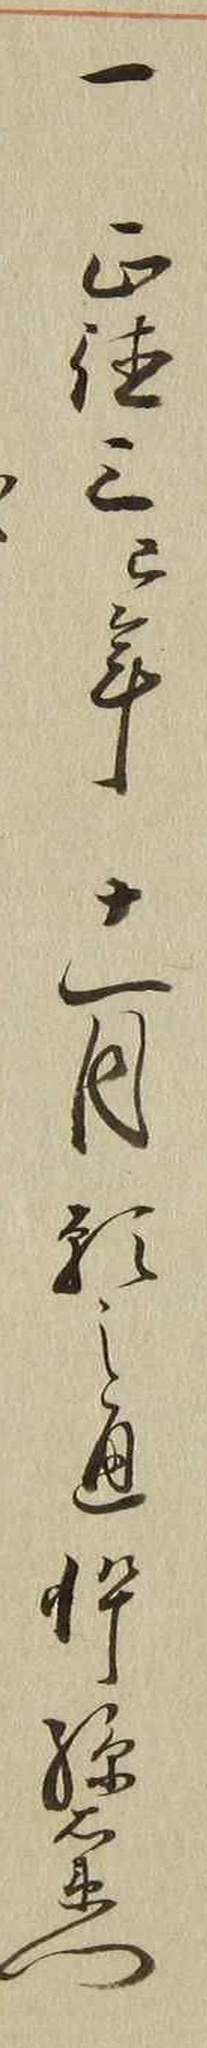一正徳三巳年十一月願之通忰孫右衛門
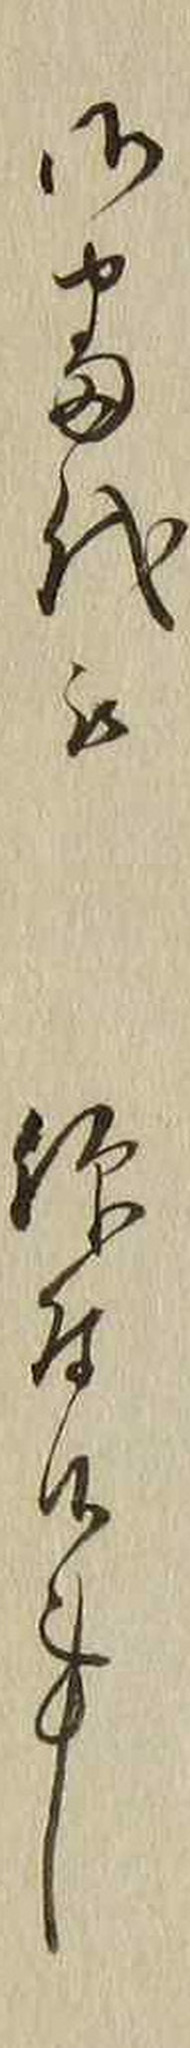御番代被仰付候事
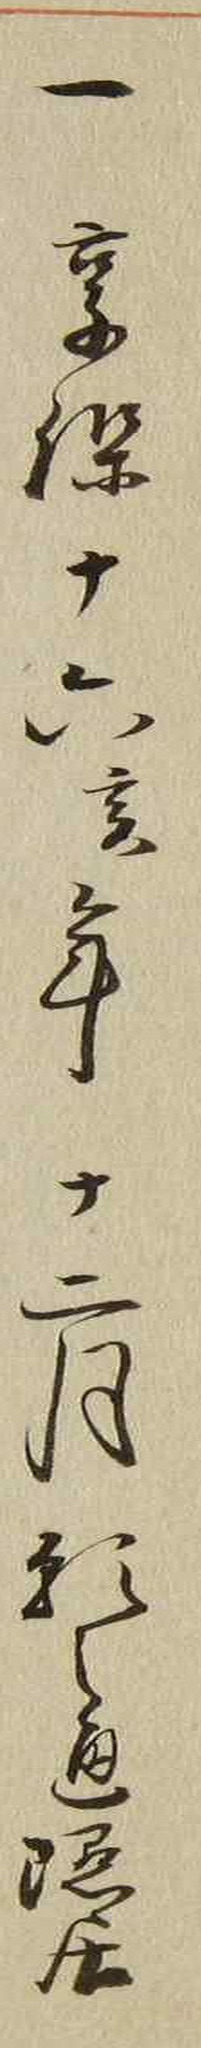一享保十六亥年十二月願之通隠居
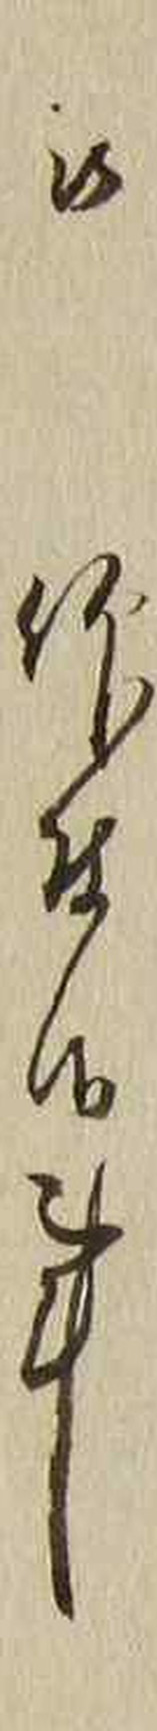被仰付候事
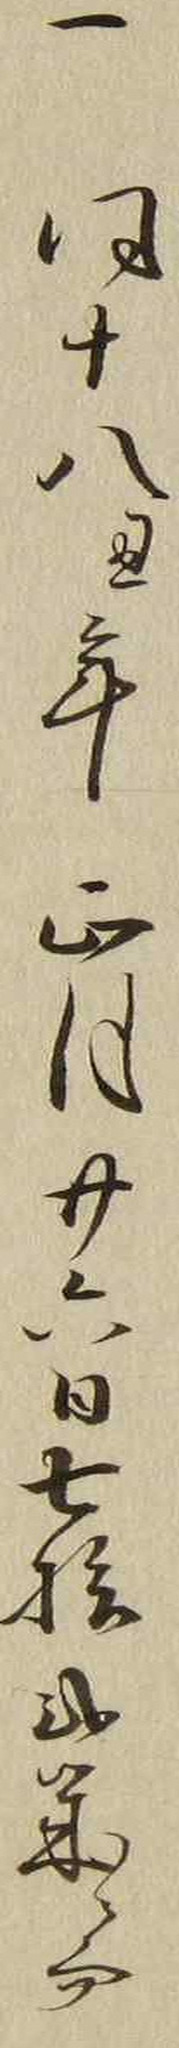一同十八丑年正月廿六日七拾弐歳ニ而
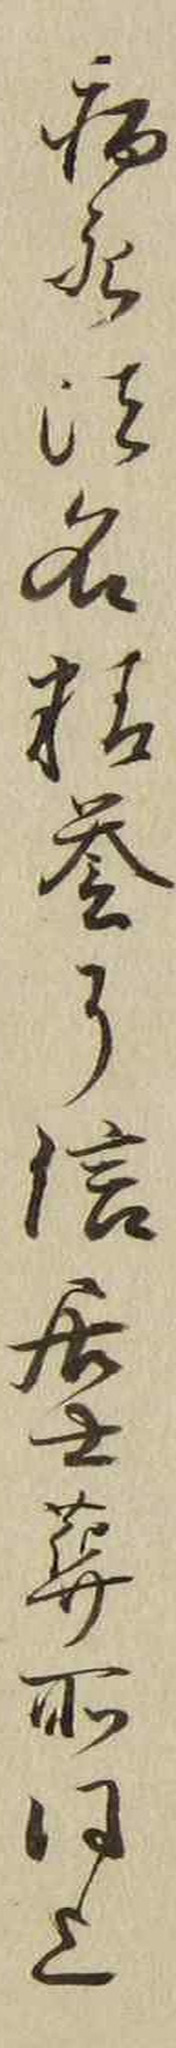病死法名精誉了信居士葬所同上

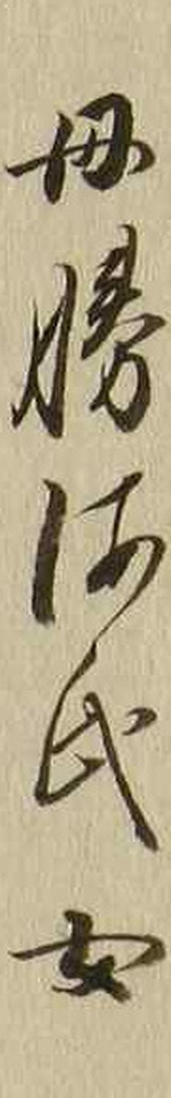母勝海氏女
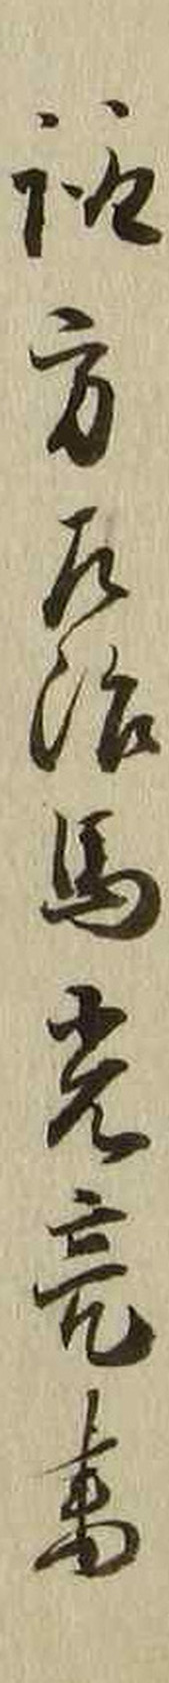女諏方左治馬光亮妻
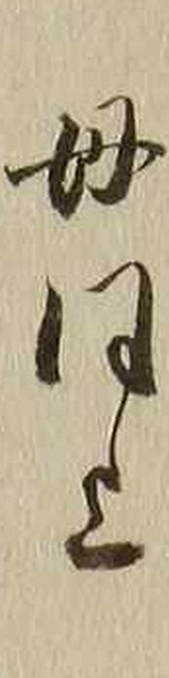母同上
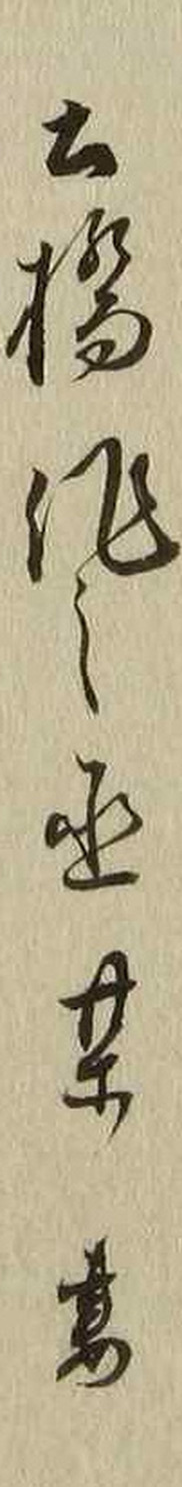女土橋作之丞某妻
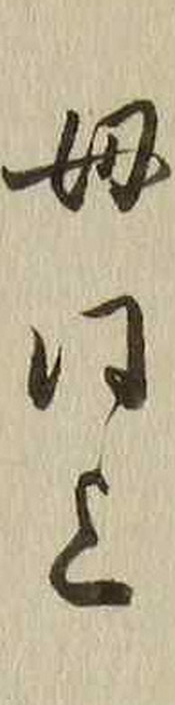母同上
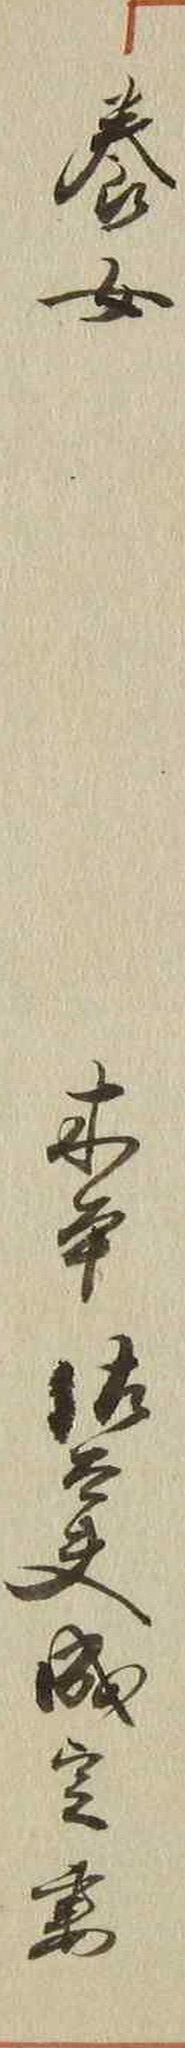養女木本佐太夫成定妻
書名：諸士系譜　巻之68　を之部2
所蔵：会津若松市立会津図書館
